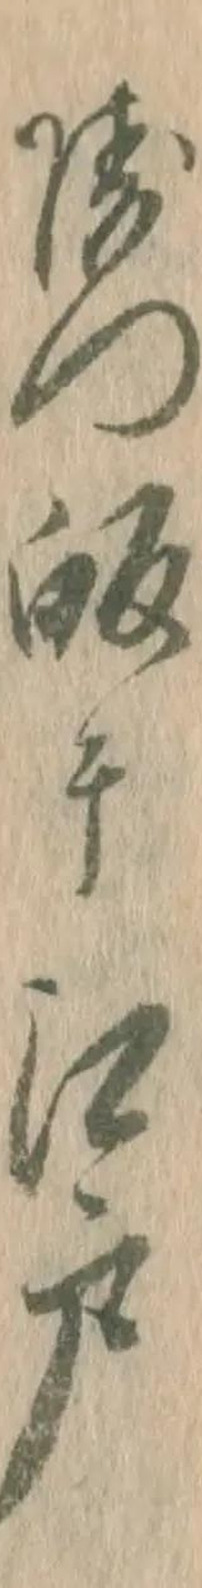衛門皈干江戸
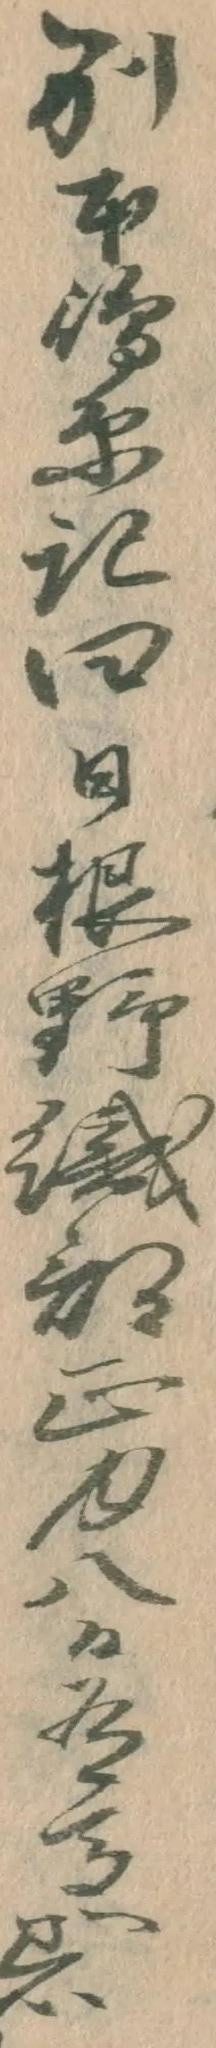別本島原記曰日根野織部正月八日有馬へ着く
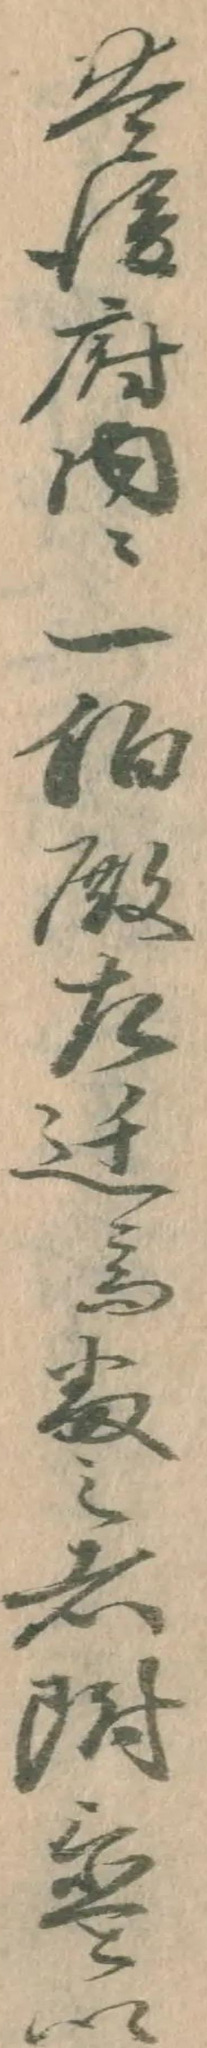豊後府内に一伯殿左迁に而番之者附置と以

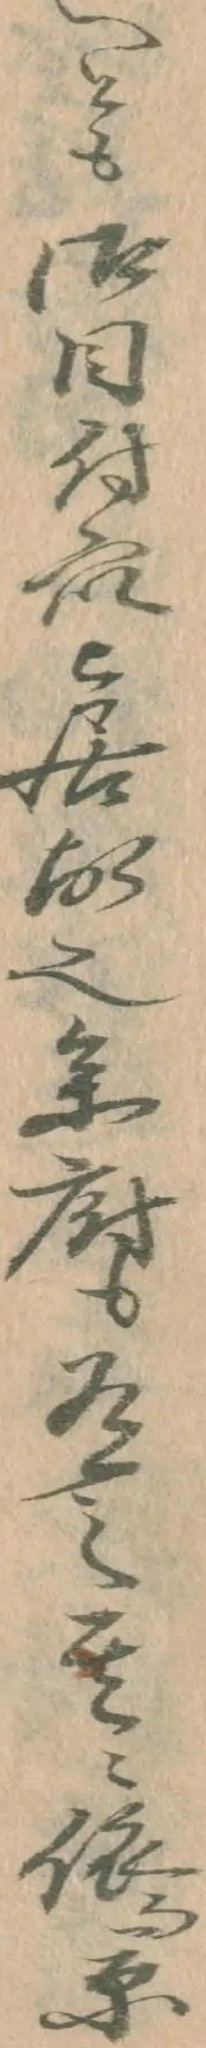へとも御目付衆被居故也参府も有之其に依而原
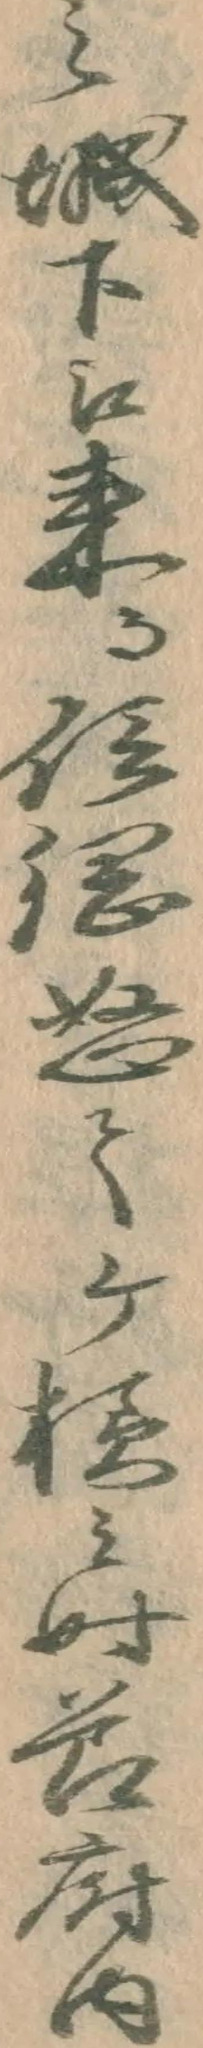之城下江来る信綱怒てけ様之時節府内
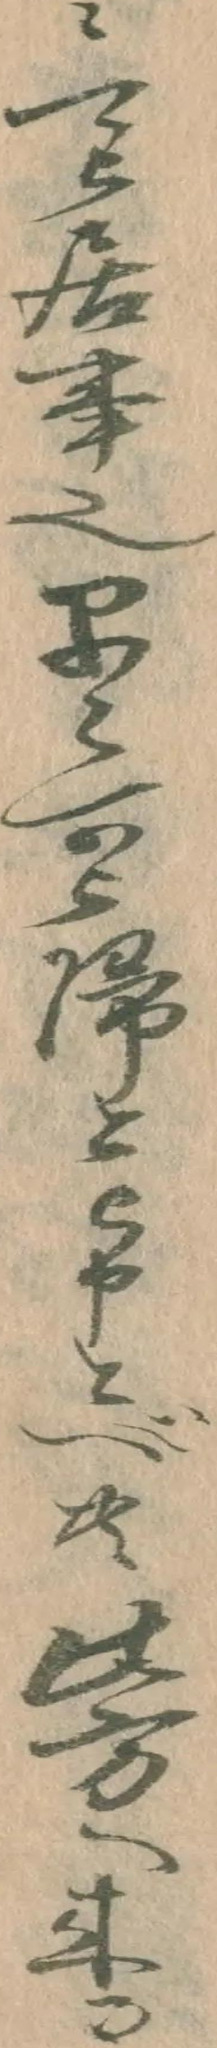に可被居事也早々可被帰と被申といへ共此方へ来る
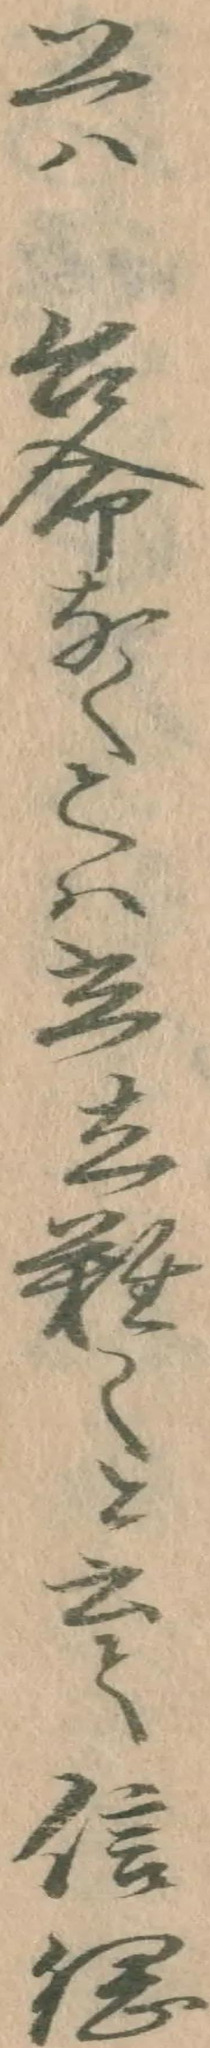上は召命なくては立去難しと云て信綱
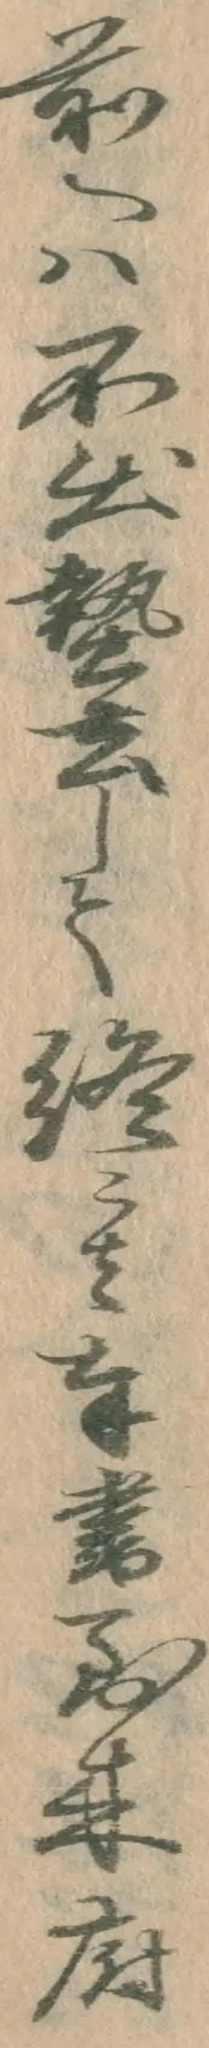前へは不出蟄去して終に者奉書至来府
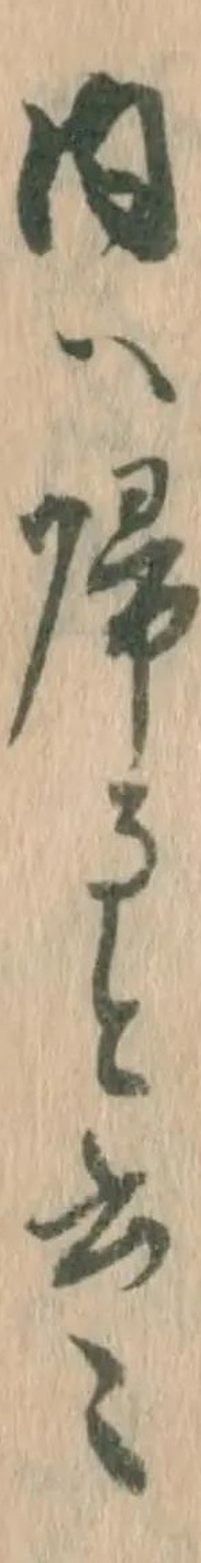内へ帰ると云々
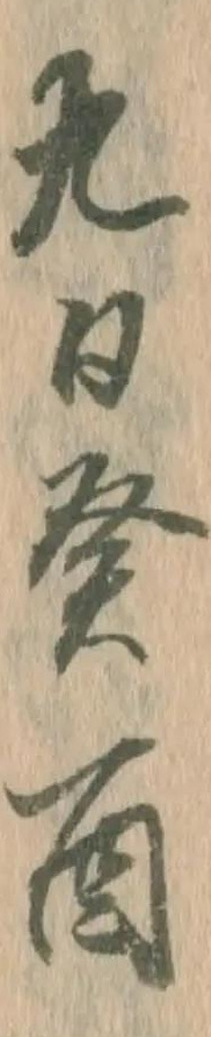九日癸酉
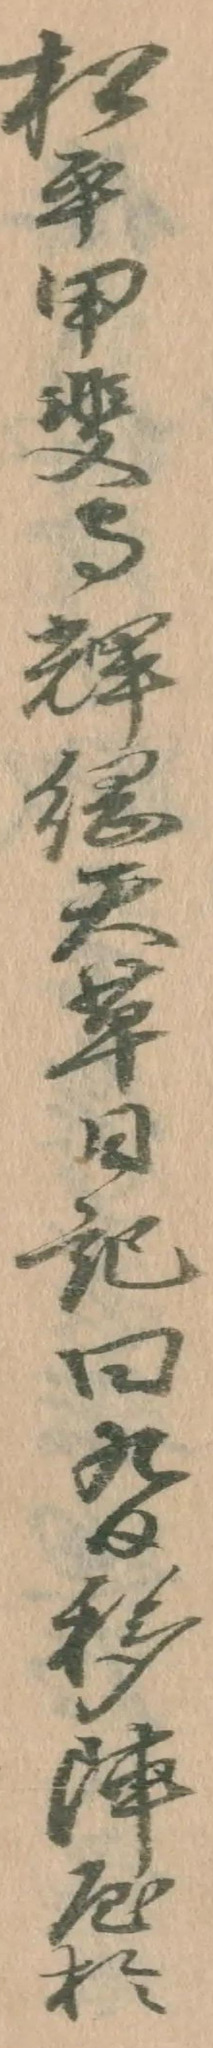松平甲斐守輝綱天草日記曰九日移陣屋於
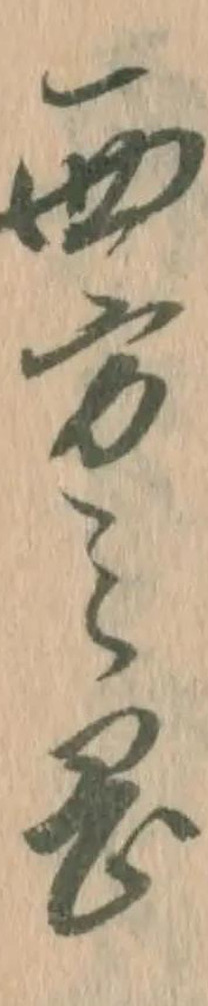西方之岡
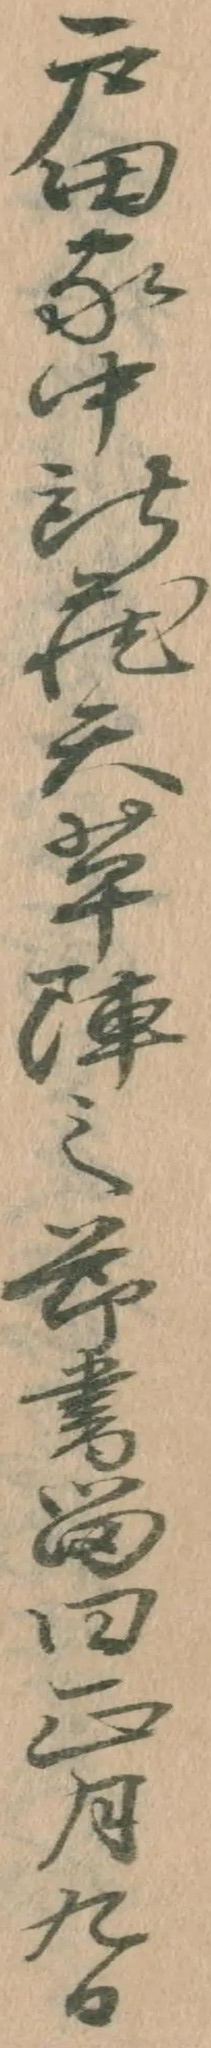戸田家中所蔵天草陣之節書留曰正月九日
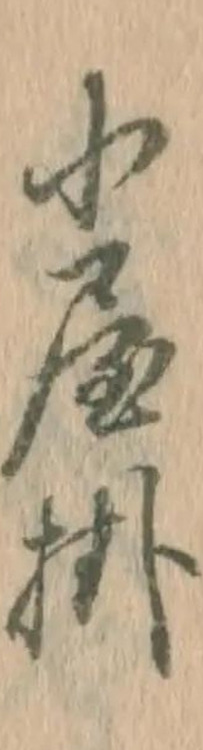小屋掛
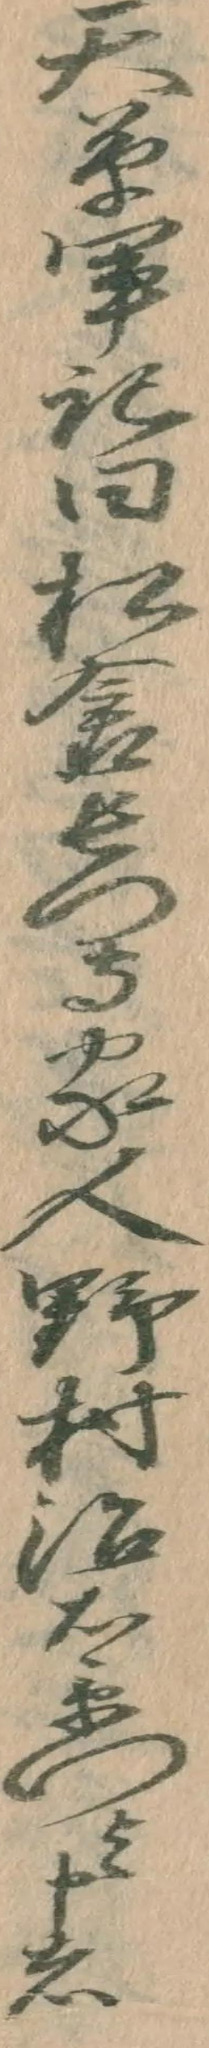天草軍記曰松倉長門守家人野村治右衛門与申者
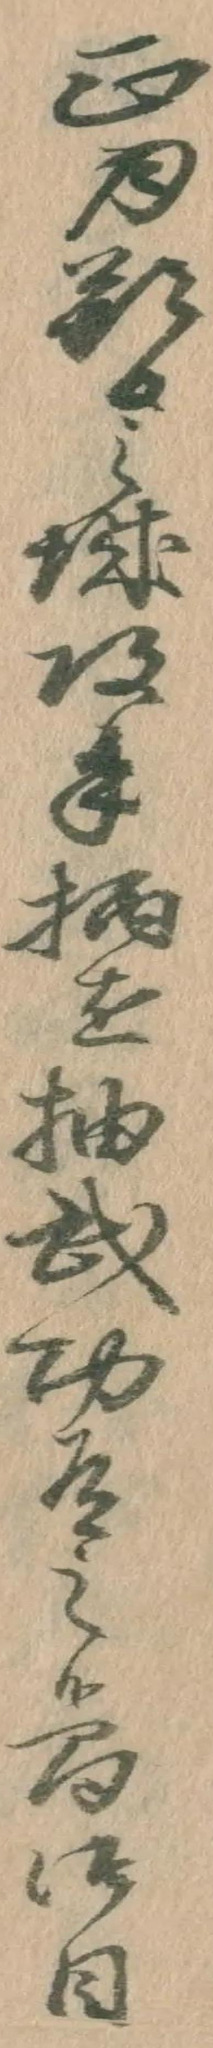正月朔日之城攻手柄を抽武功有之候間御目
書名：切支丹御退治記 49巻. [5]
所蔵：国立国会図書館 National Diet Library, JAPAN
